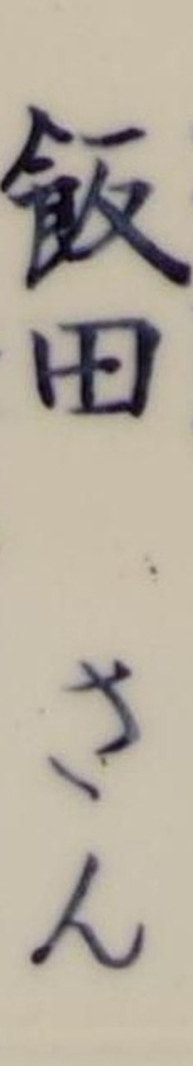飯田さん
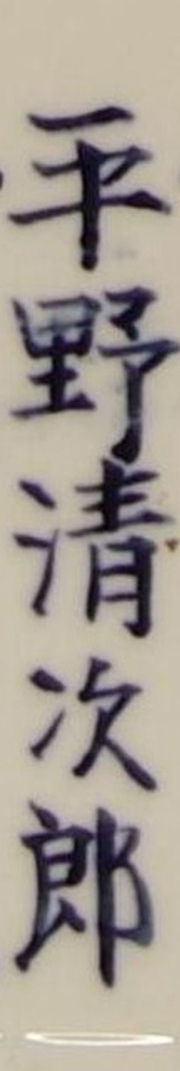平野清次郎
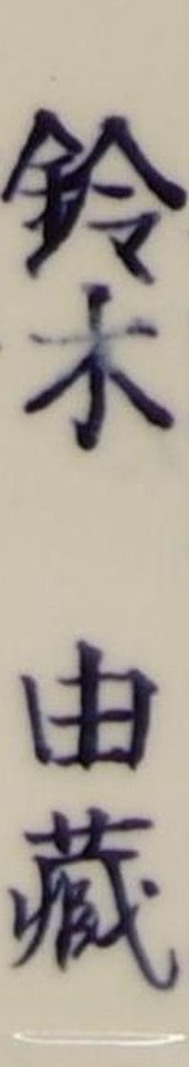鈴木由蔵
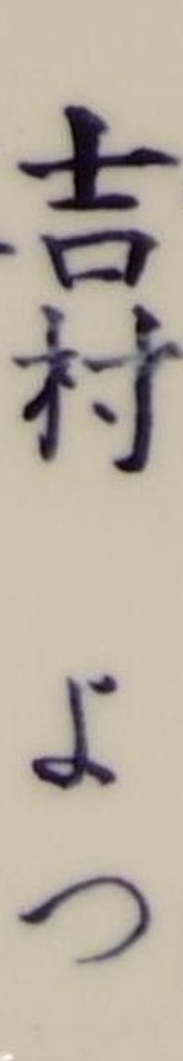吉村よつ
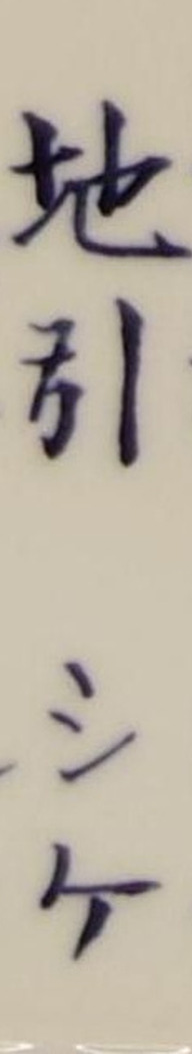地引シケ
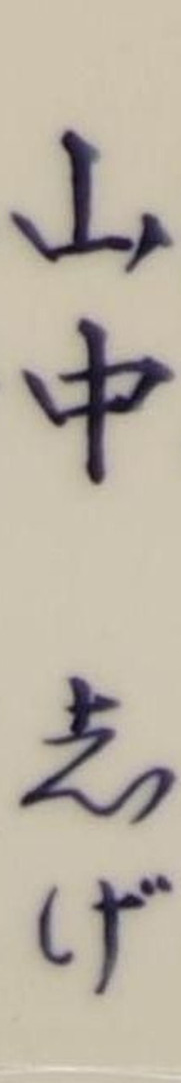山中しげ

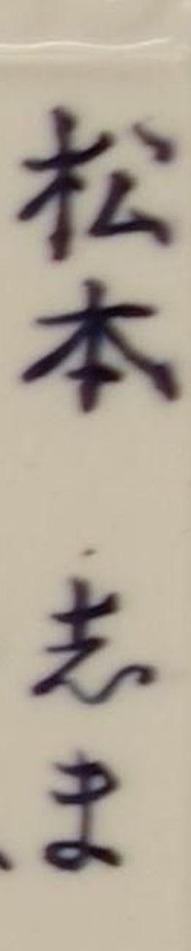松本しま
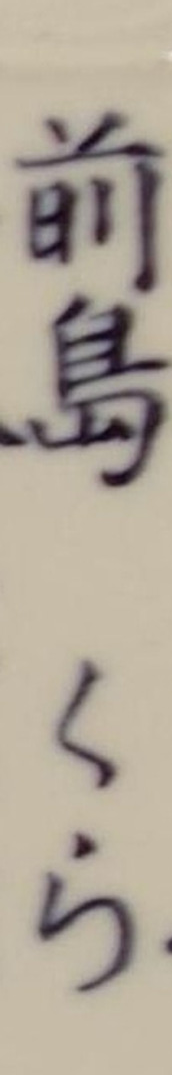前島くら
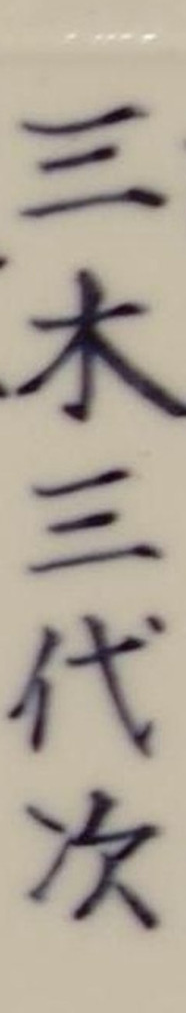三木三代次
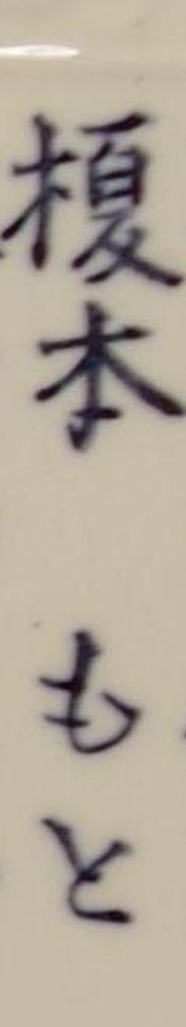榎本もと
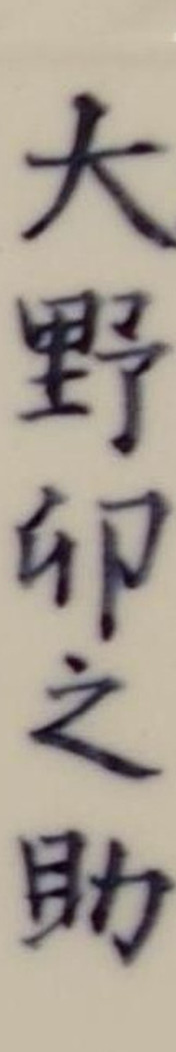大野卯之助
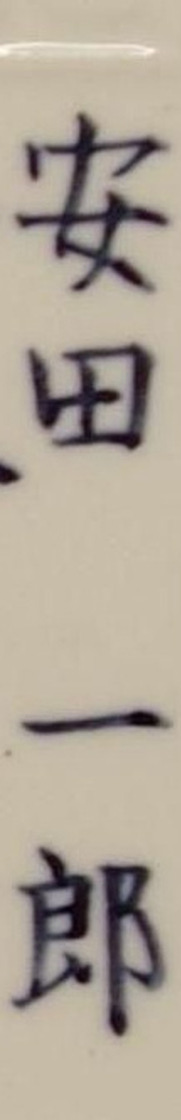安田一郎
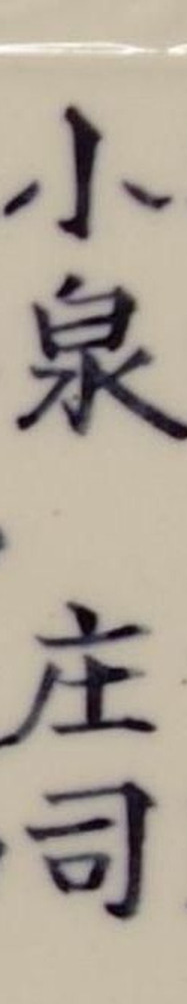小泉庄司
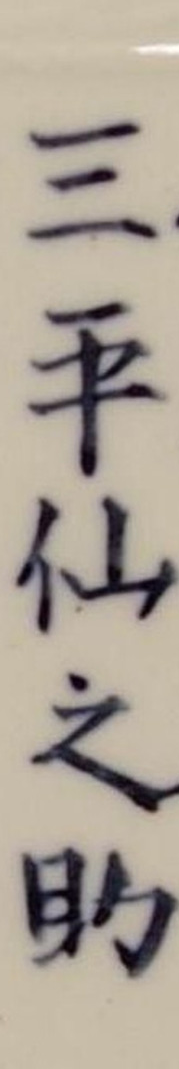三平仙之助
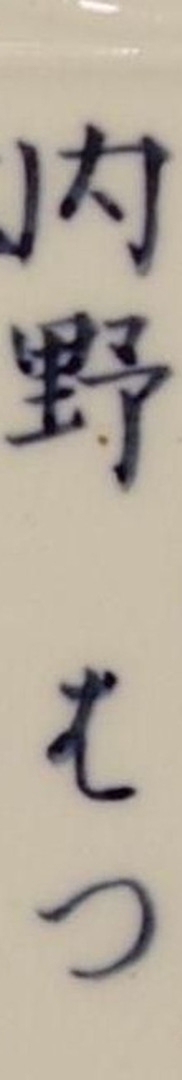内野はつ
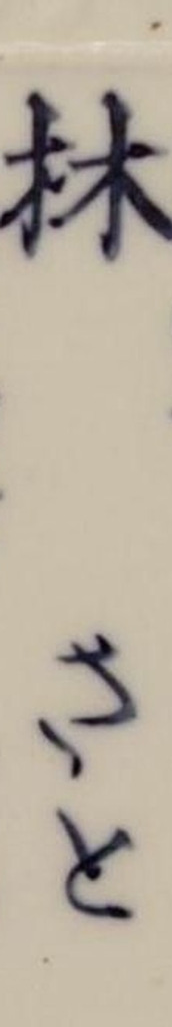林さと
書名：E~L
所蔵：高野山金剛峯寺
